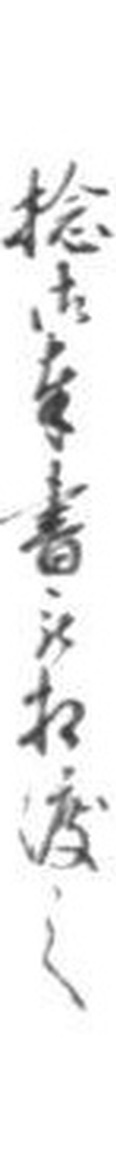捻御奉書被相渡之
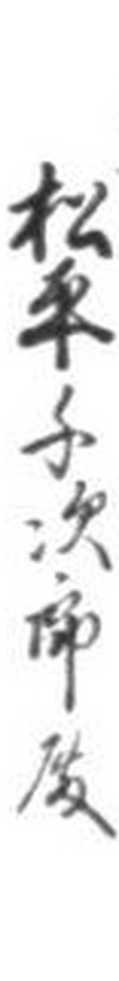松平千次郎殿信賢
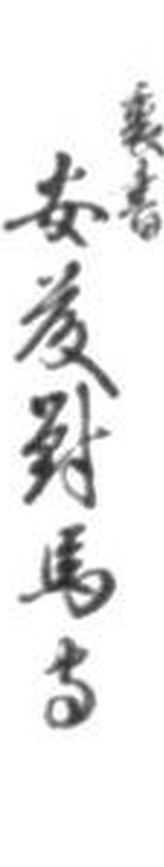安藤対馬守
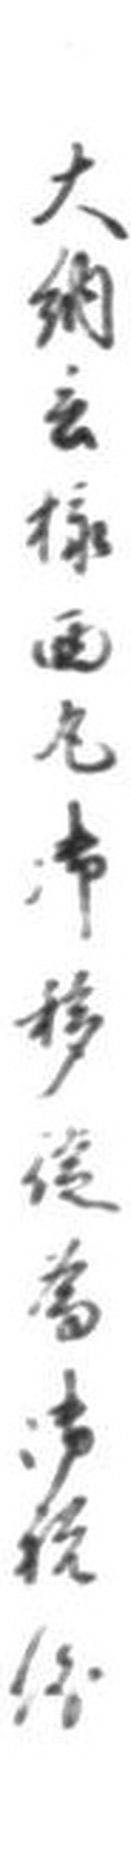大納言様西丸御移徙為御祝儀
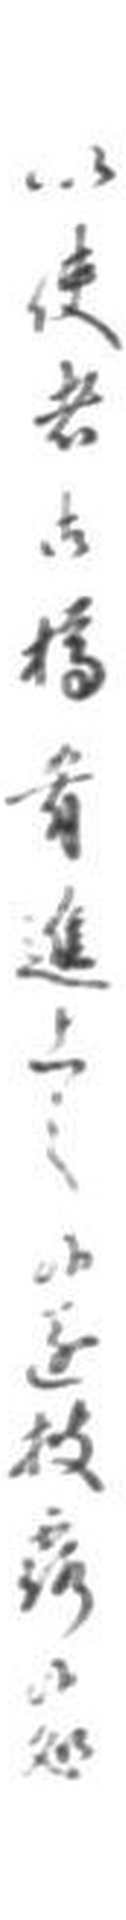以使者御樽肴進上之候遂披露候処
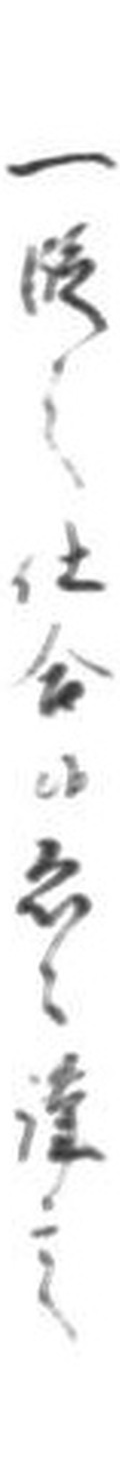一段之仕合候恐々謹言
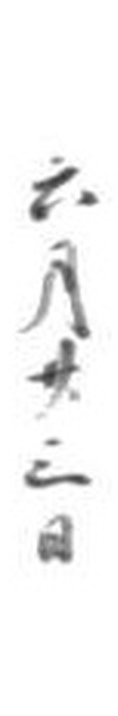六月廿三日
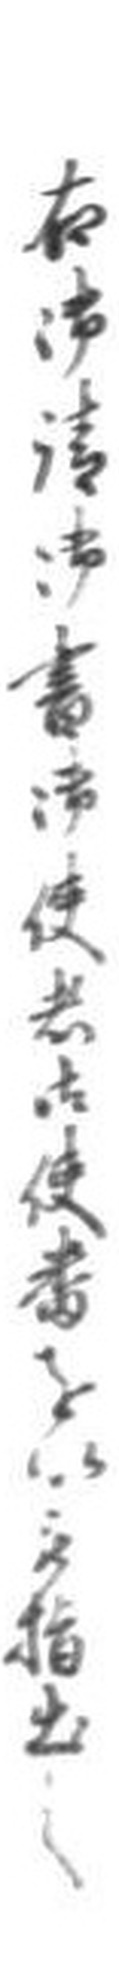右御請御書御使者御使番を以被指出之
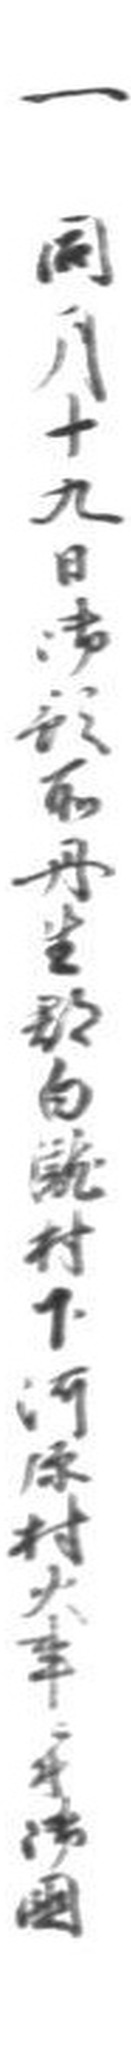一同月十九日御預所丹生郡白瀧村下河原村大事ニ付御国
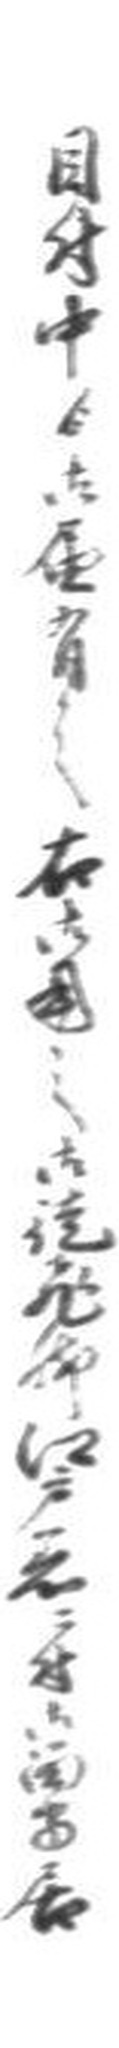目付中ゟ御届有之右御用之御徒飛脚江戸着ニ付御留守居

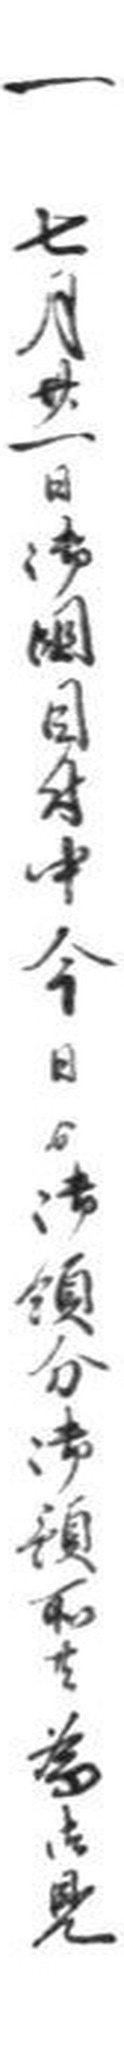一七月廿一日御国目付中今日ゟ御領分御預所共為御見
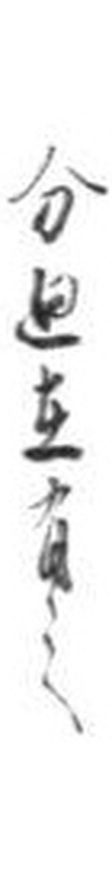分廻在有之
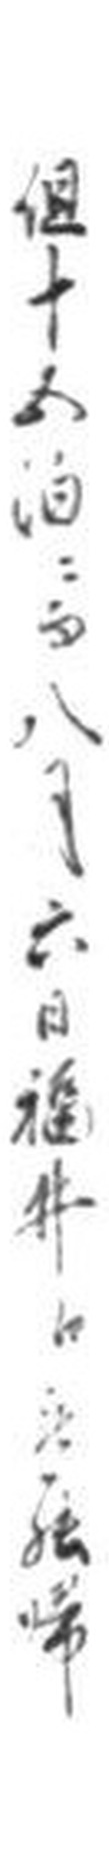但十五泊ニ而八月六日福井江被罷帰
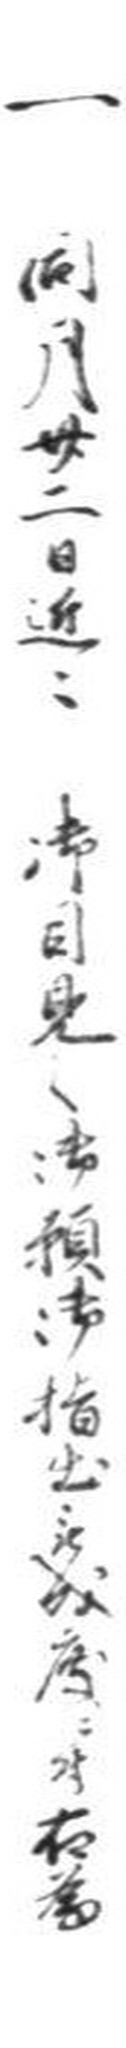一同月廿二日近々御目見之御願御指出被成度ニ付右為
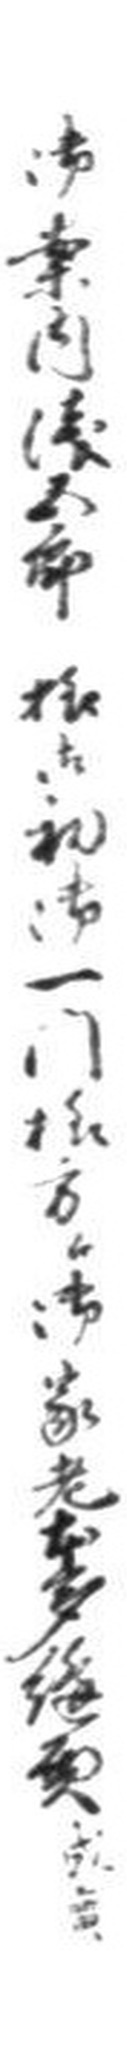御案内浅五郎様御初御一門様方江御家老本多縫殿成広
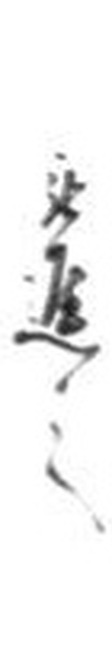被進之
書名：家譜 三十九 宗矩公 享保十年
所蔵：福井県文書館 Fukui Prefectural Archives
